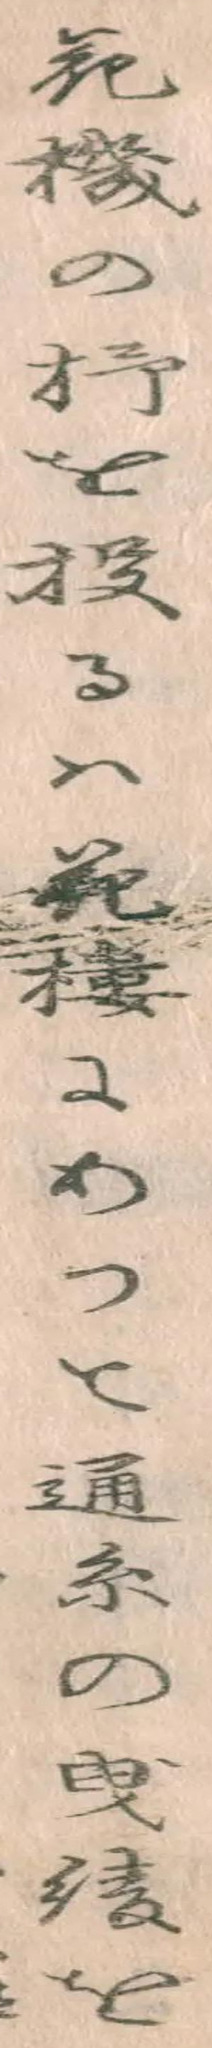花機の杼を投るは花楼にあつて通糸の曳綾を
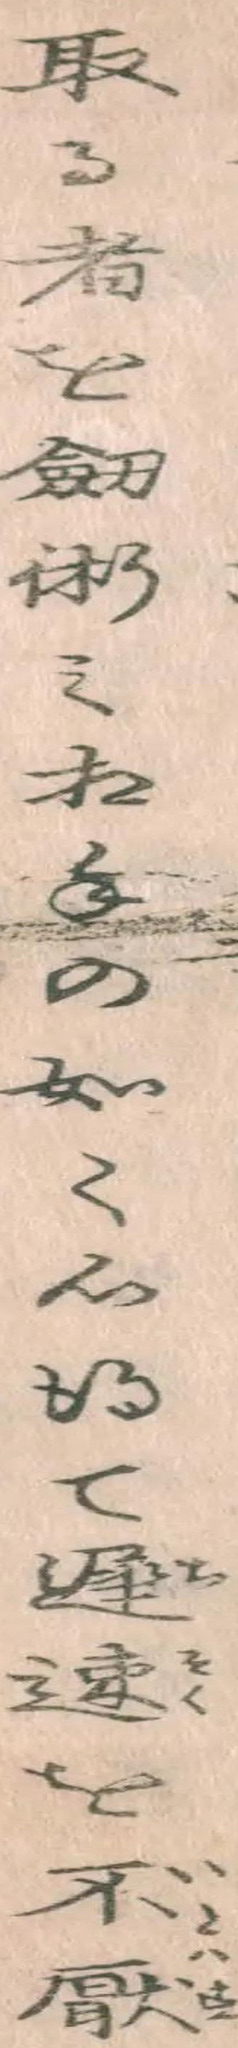取る者を剣術之相手の如く心得て遅速を不厭
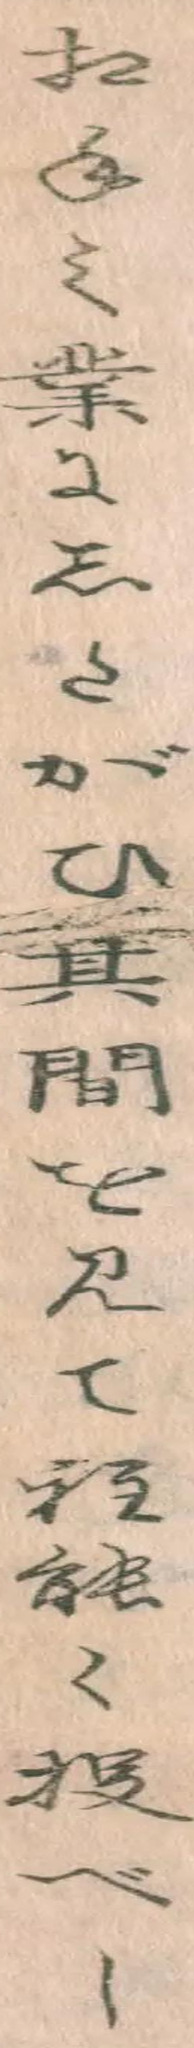相手之業にしたがひ其間を見て程能く投べし
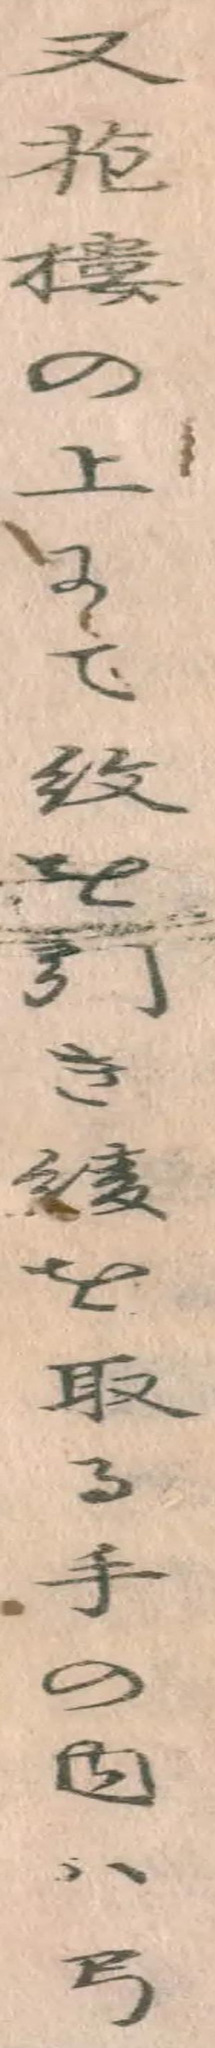又花楼の上にて紋を引き綾を取る手の内は弓
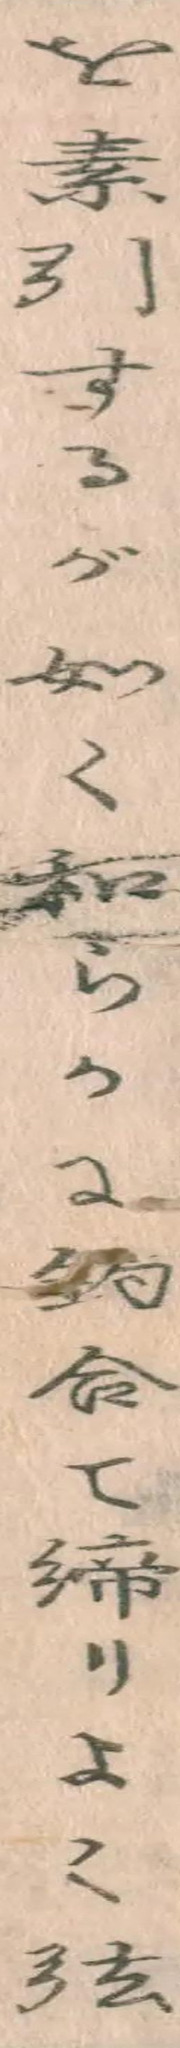を素引するが如く和らかに釣合て締りよく弦
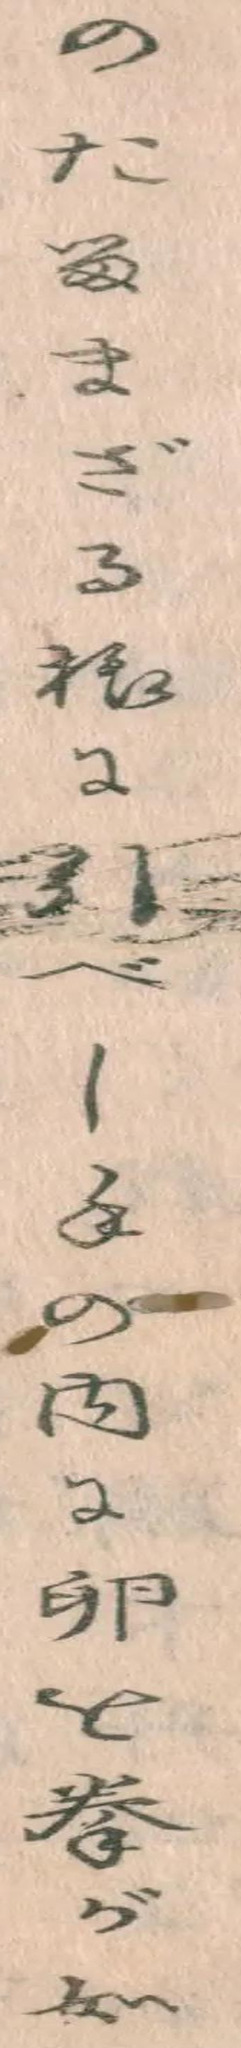のたるまざる様に引べし手の内に卵を拳が如
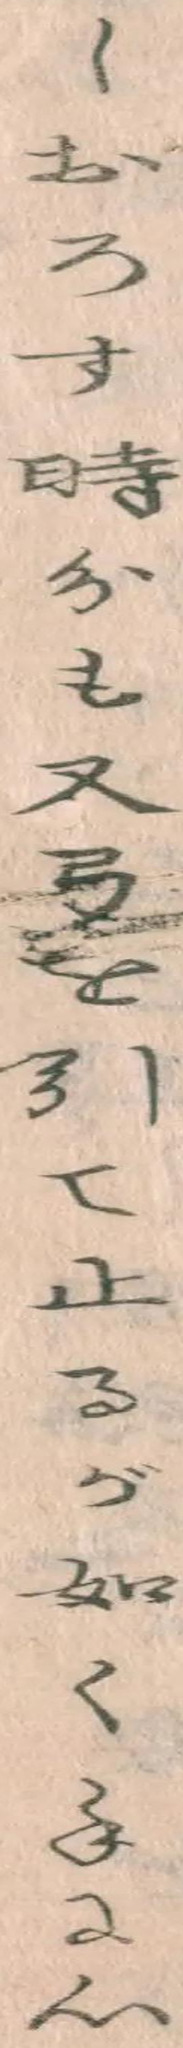しおろす時分も又弓を引て止るが如く手に心
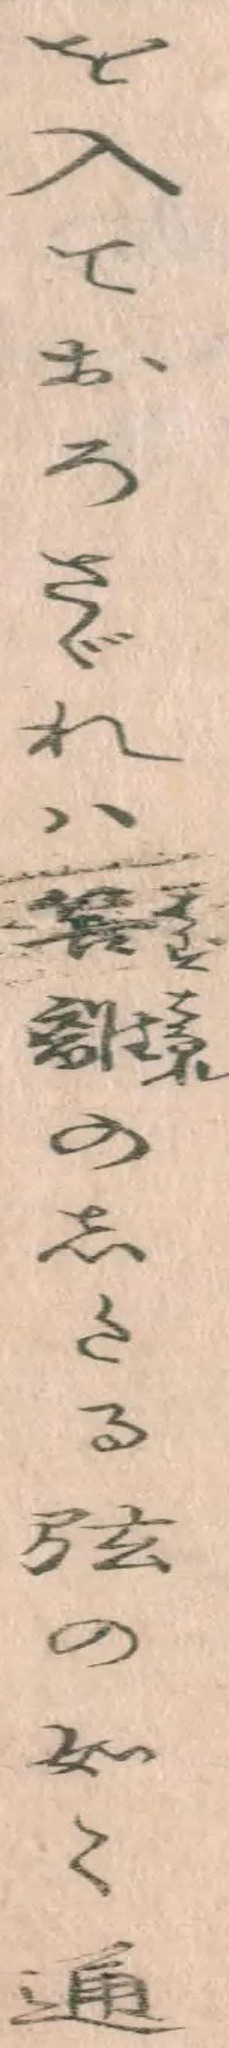を入ておろさゞれは筈離のしたる弦の如く通
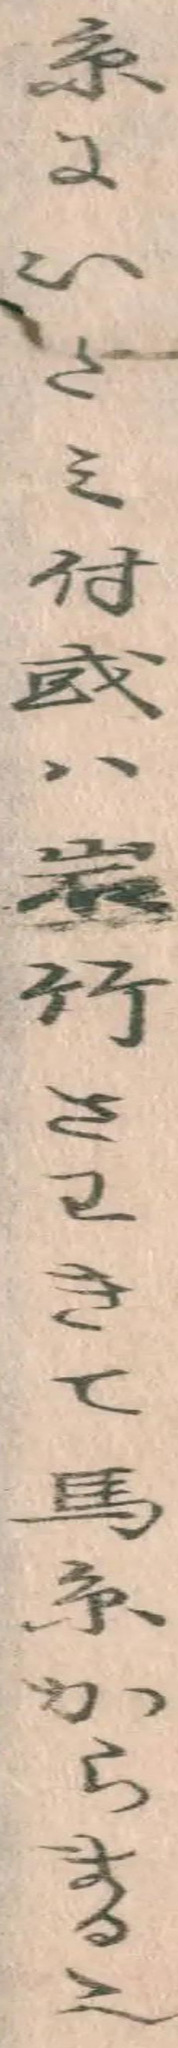糸にいたみ付或は岩竹さわきて馬糸からまる也
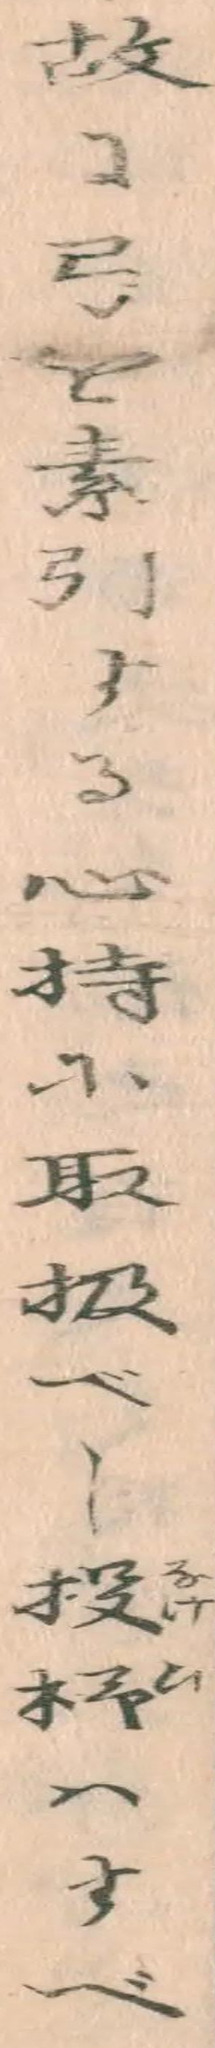故に弓を素引する心持に取扱べし投杼はすべ
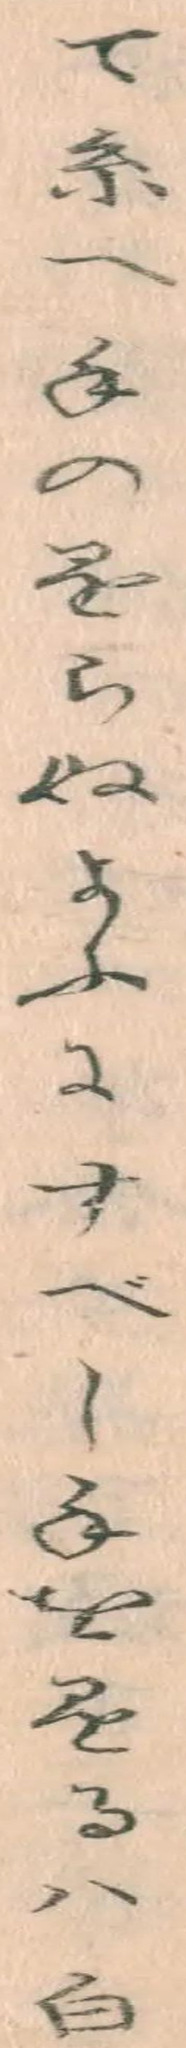て糸へ手の懸らぬよふにすべし手を懸るは白
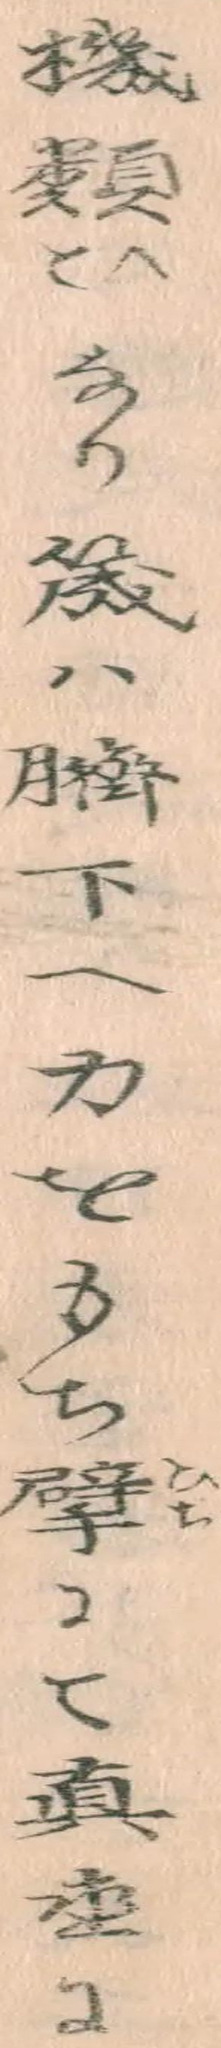機類ひなり筬は臍下へ力をもち擘にて真直に
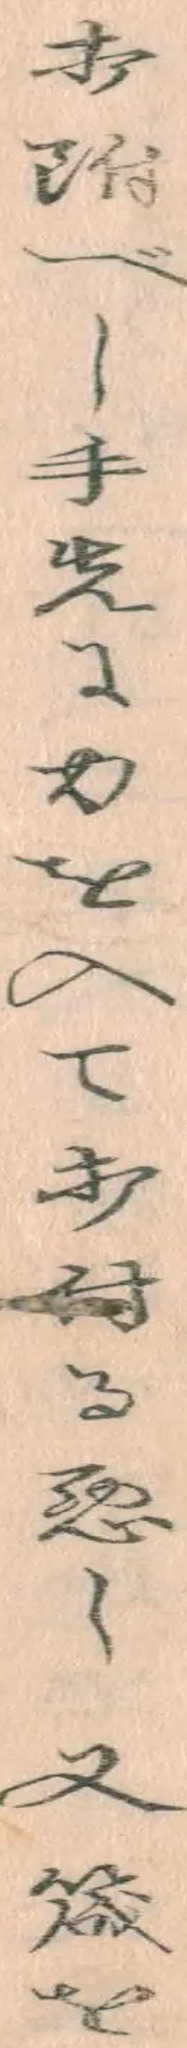打附べし手先に力を入て打付る悪し又筬を
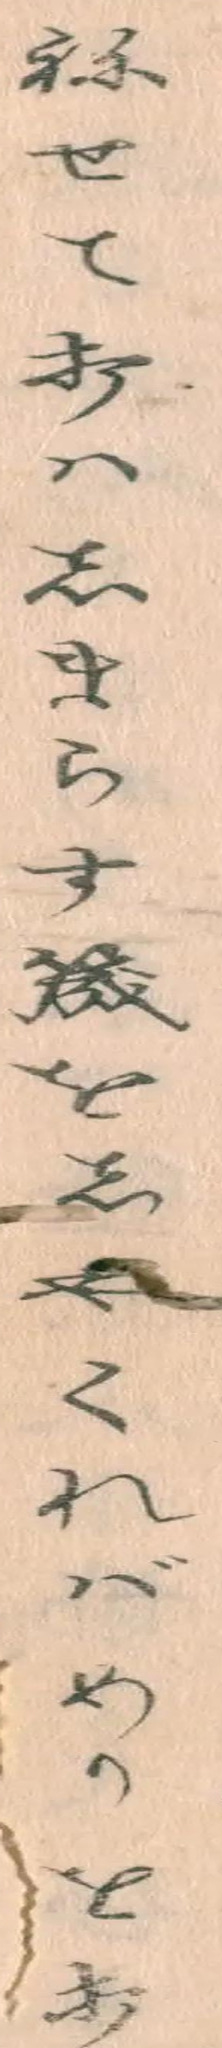ねせて打はしまらす筬をしやくればめりを打
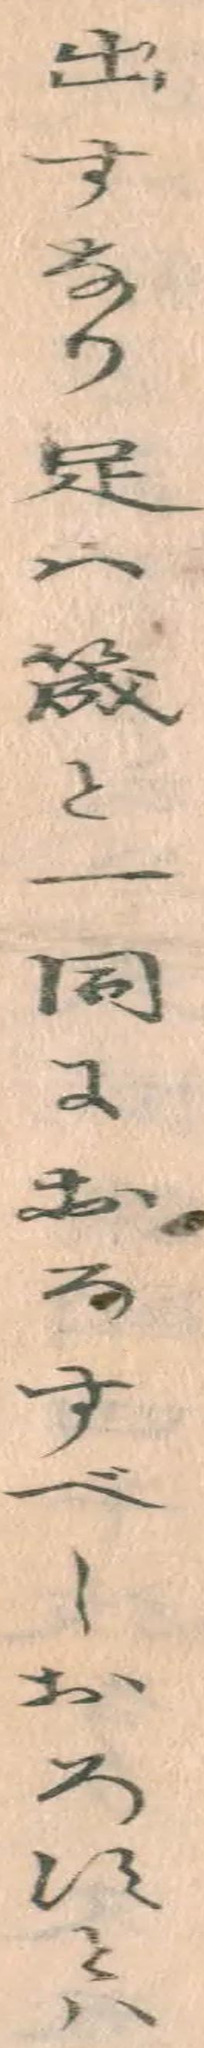出すなり足は筬と一同におろすべしおろすとは
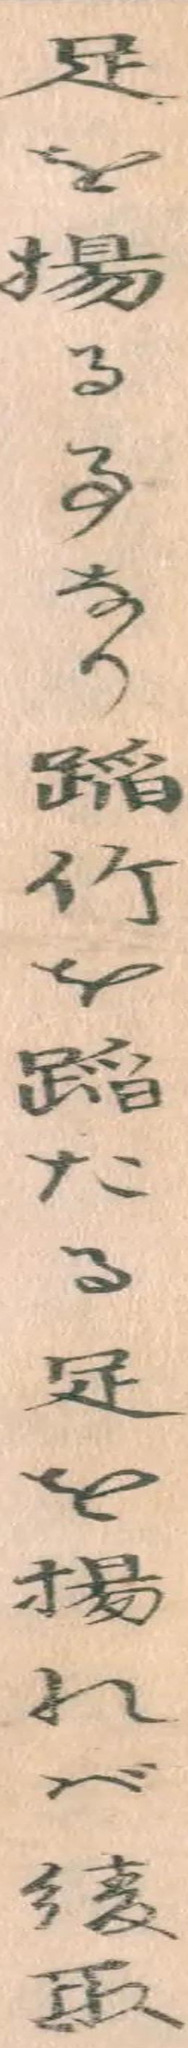足を揚る事なり蹈竹を蹈たる足を揚れば綾取
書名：機織彙編 5巻. [2]
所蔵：国立国会図書館 National Diet Library, JAPAN
